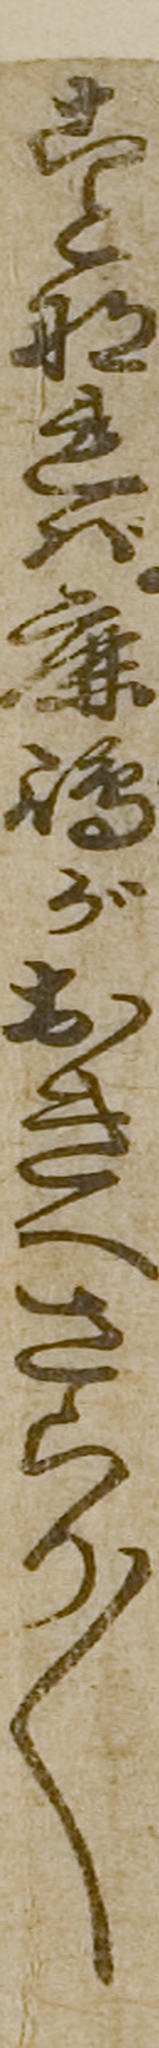ことなれば鹿嶋がおきへさらり〳〵
